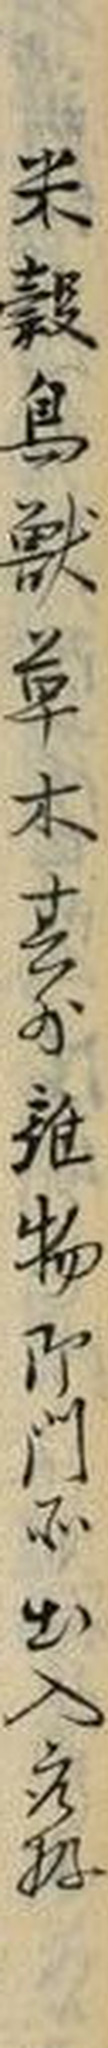米穀鳥獣草木其外雑物御門所出入取扱
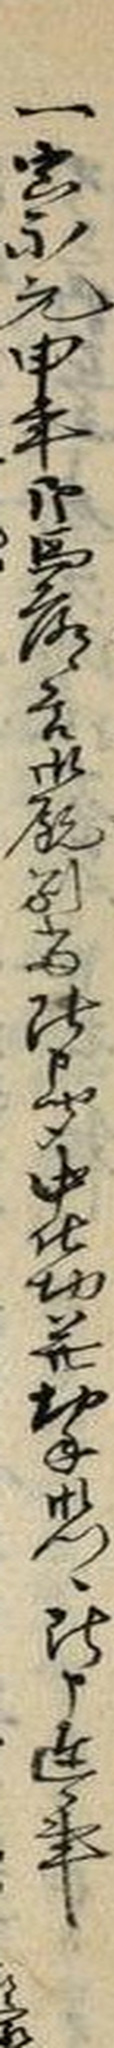一宝永元申年御馬落候節御厩別当断申聞中仕切并切手御門へ断申達候事
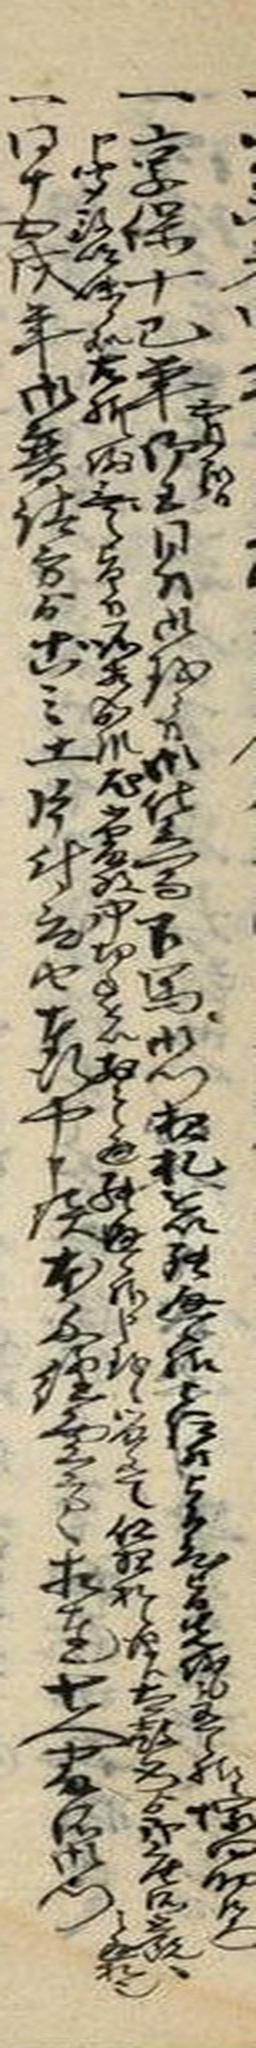一同十五戌年御普請方ゟごみ土片付度由奉行中申談本多縫殿方へ相達七人番所御門
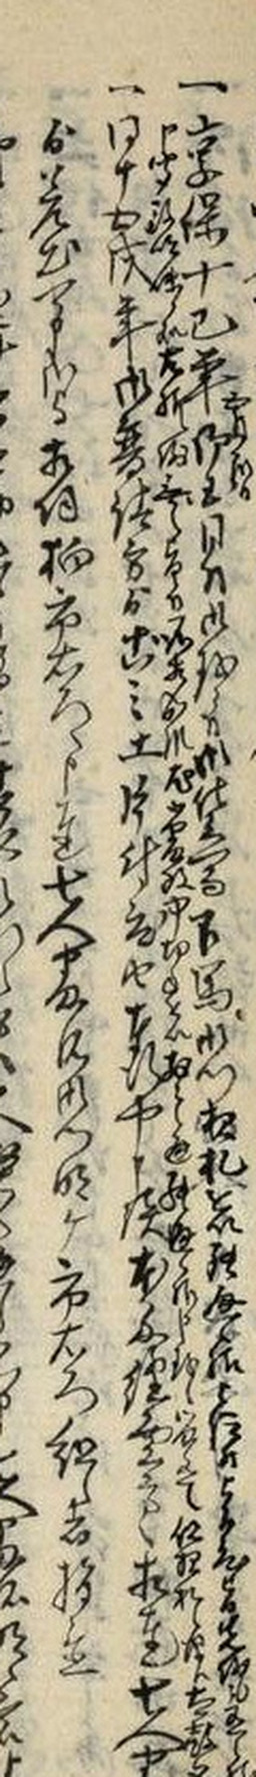一同十五戌年御普請方ゟごみ土片付度由奉行中申談本多縫殿方へ相達七人番所御門
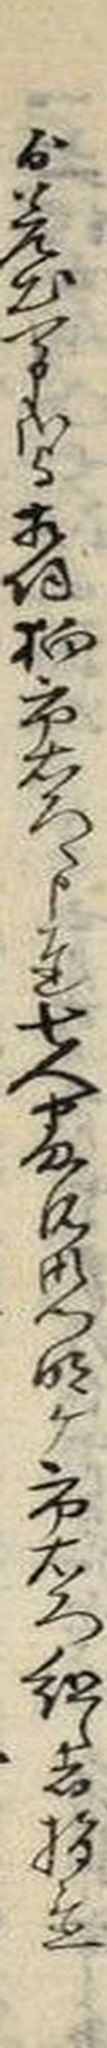ゟ差出可申哉と相伺狛市右衛門へ申達七人番所御門明ケ市右衛門組之者指置
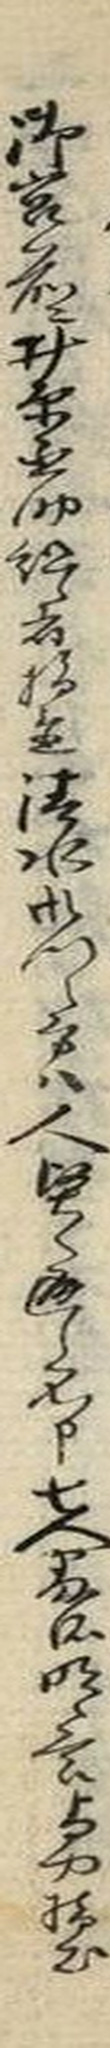御宮前に井原丞助組之者指置清水御門之方は人堅く通不申七人番所明候節与力指出
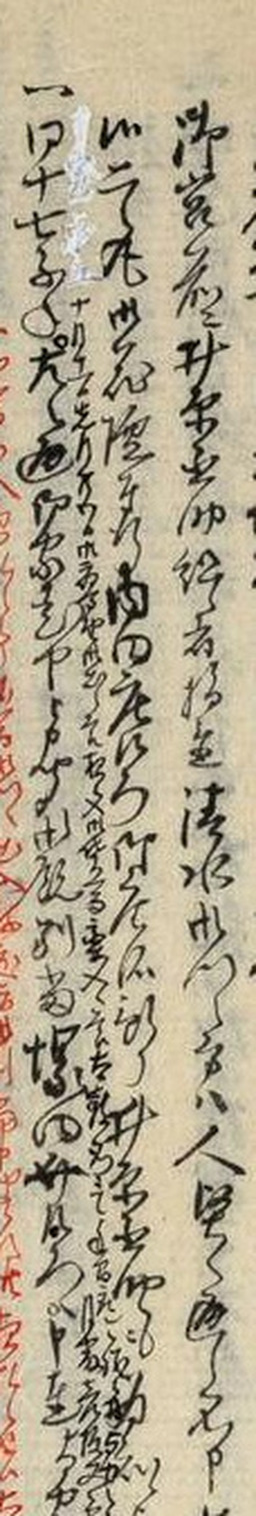候二之丸御花壇奉行内田庄左衛門御座所預り井原丞助へも為知候旨留有之
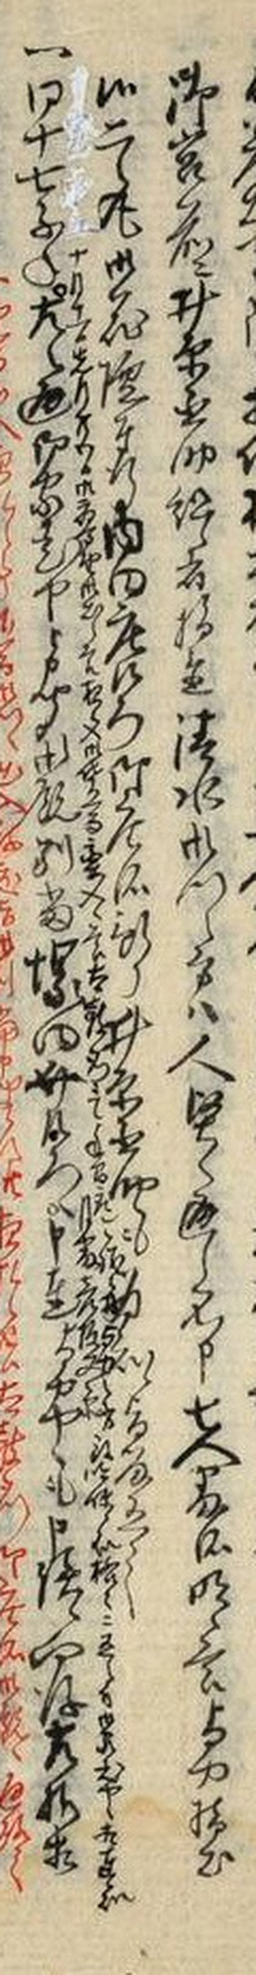候二之丸御花壇奉行内田庄左衛門御座所預り井原丞助へも為知候旨留有之
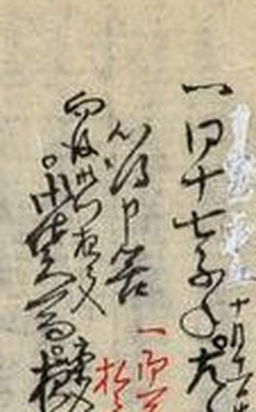心得申筈
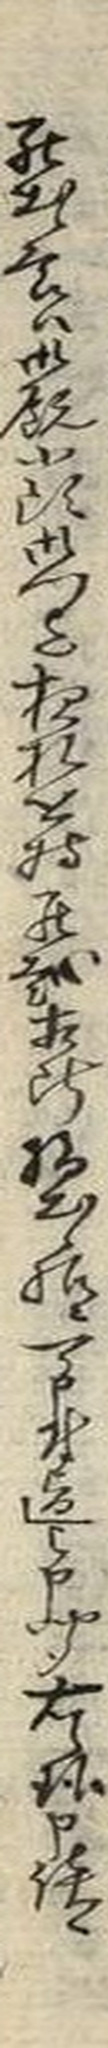罷出候節は御厩小頭御門迄夜札を持罷越相断指出候様可申付旨」被申聞右之趣申談候
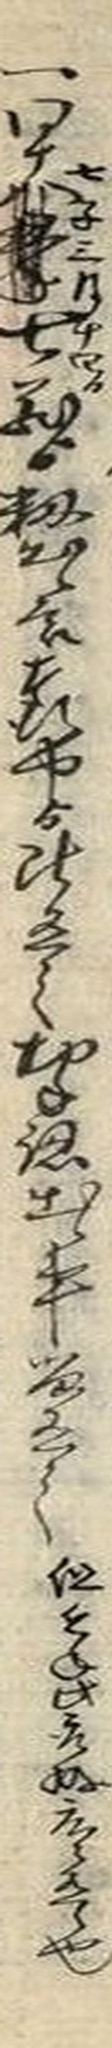一同十七子三月十四日七蔵ゟ籾出候節奉行中ゟ断有之切手認出候事留有之但近年此取扱度々有之也
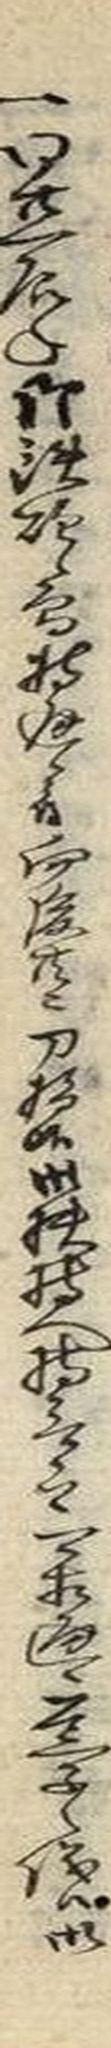一同廿一辰年御鉄炮之鳥持通候に付向後共に刀指候御扶持人持参候はゝ可相通候荒子儀は御
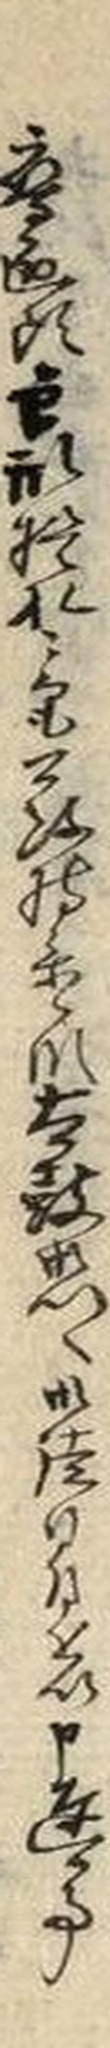鷹匠頭印形提礼に而も可致持参候段太鼓御門へ御徒目付を以申達候事
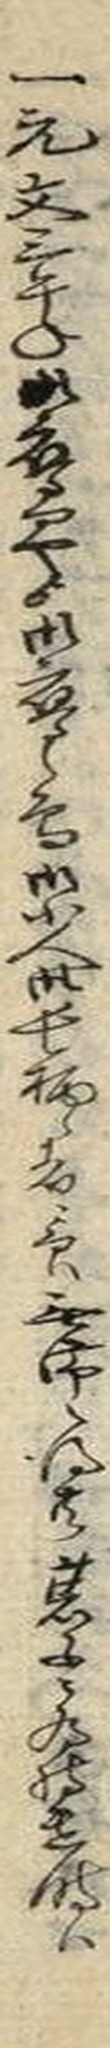一元文三午年御鷹部屋ゟ御鷹之鳥御小人御長柄之者に而は無滞候得共荒子に為持遣時は
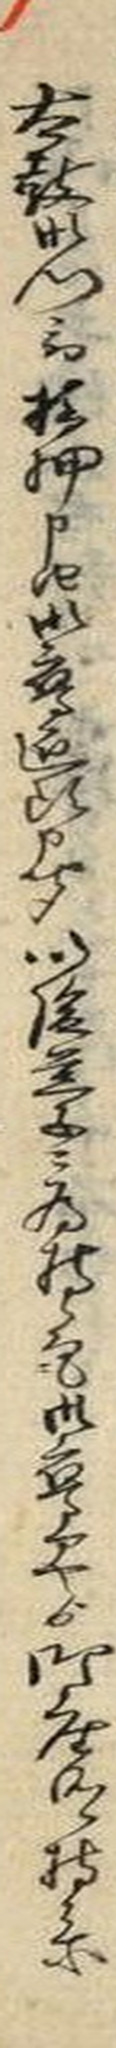太鼓御門に而指押申由御鷹匠頭申聞以後荒子に為持候而も御鷹部屋ゟ御座所へ持参

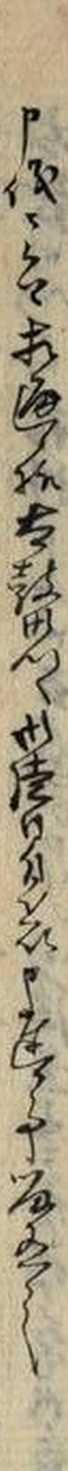申儀に候はゝ相通候様太鼓御門へ御徒目付を以申達候事留之
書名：御門御櫓之部
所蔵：福井県文書館 Fukui Prefectural Archives
